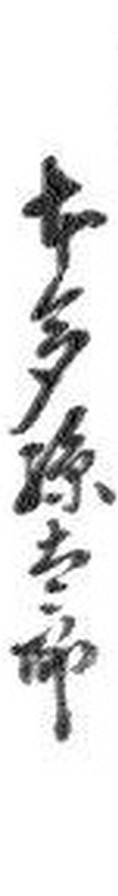本多孫太郎
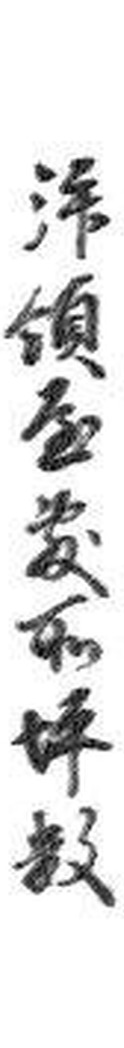拝領屋敷所坪数
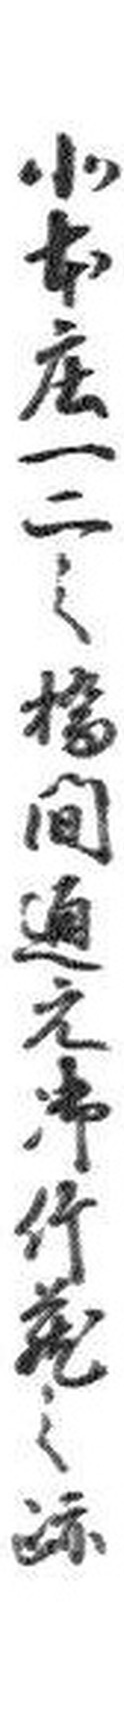北本庄一二之橋間通元御竹蔵之跡
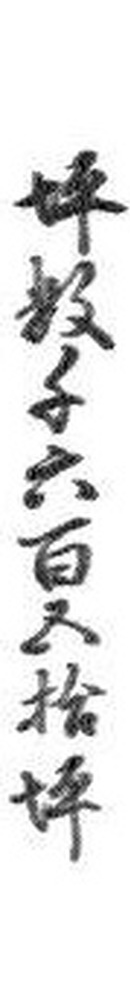坪数千六百五拾坪
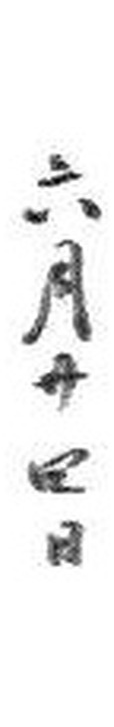六月廿四日
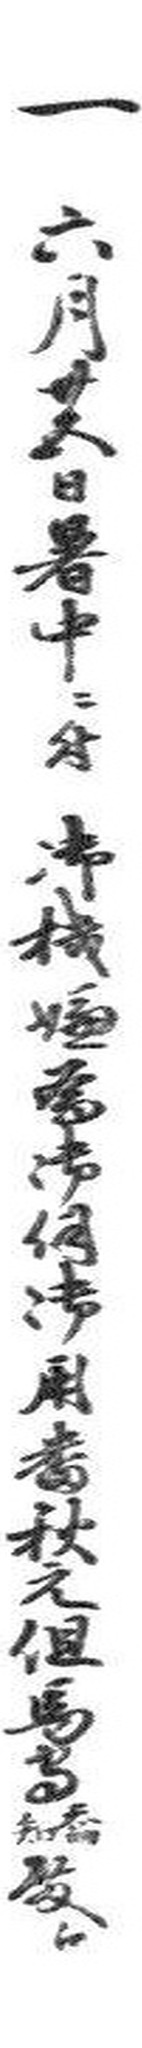一六月廿五日暑中ニ付御機嫌為御伺御用番秋元但馬守喬知殿江
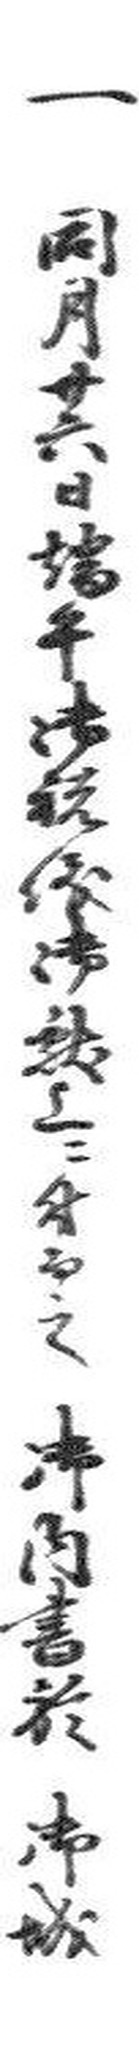一同月廿六日端午御祝儀御献上ニ付而之御内書於御城
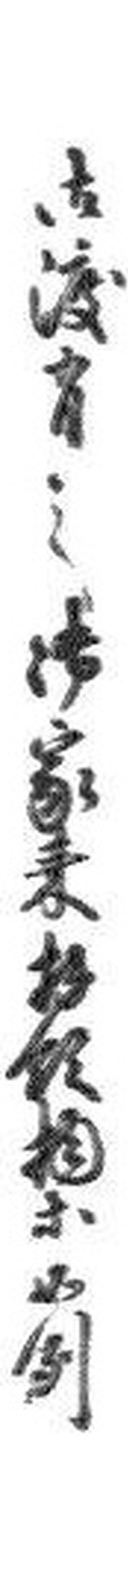御渡有之御家来拝領物等如例
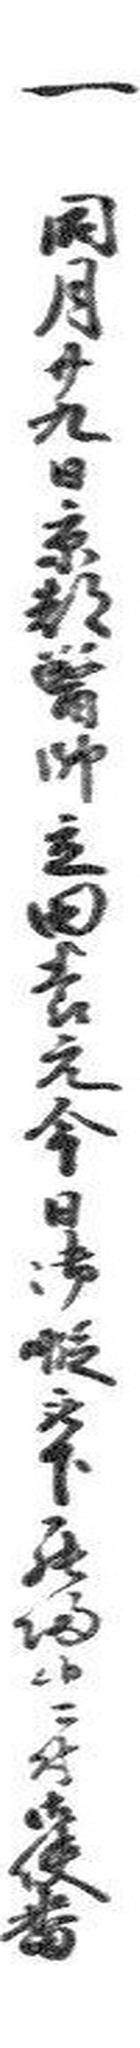一同月廿九日京都医師立田養元今日御暇被下罷帰候ニ付御使番

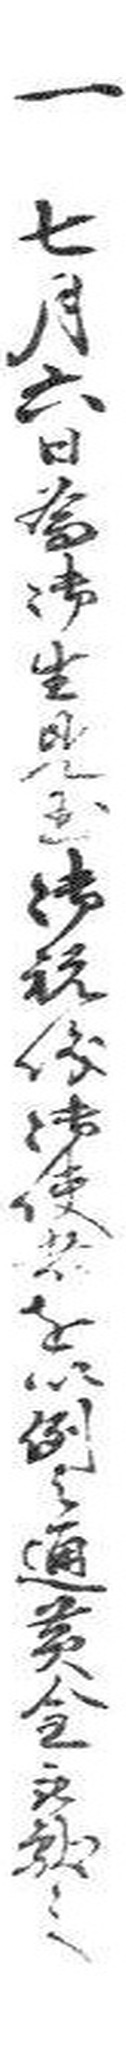一七月六日為御生身魂御祝儀御使者を以例之通黄金被献之
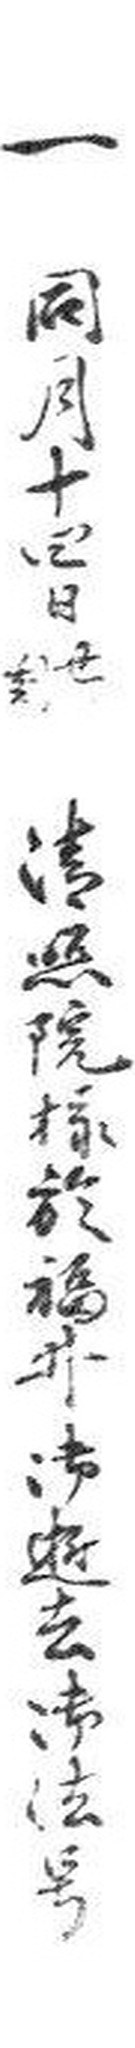一同月十四日丑刻清照院様於福井御逝去御法号
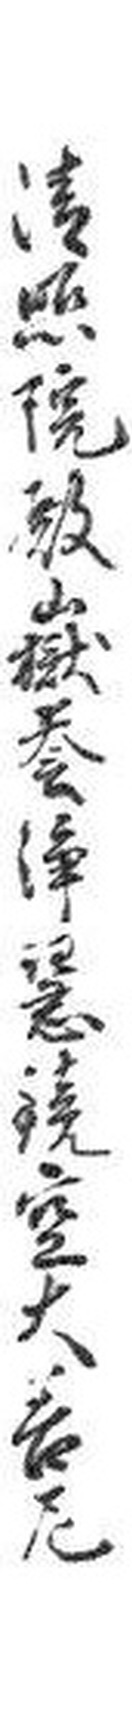清照院殿嶽誉浄慧鏡空大善尼
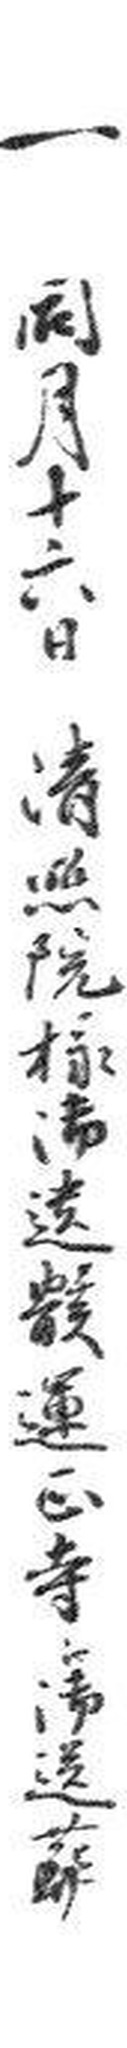一同月十六日清照院殿御遺骸運正寺江御送葬
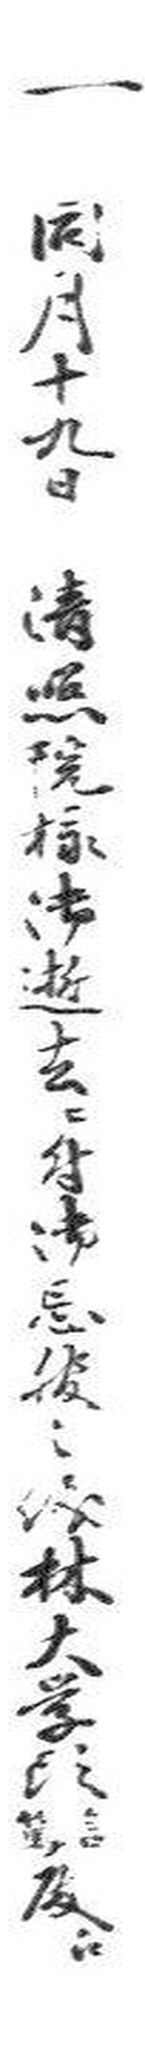一同月十九日清照院様御逝去ニ付御忌服之儀林大学信篤殿江
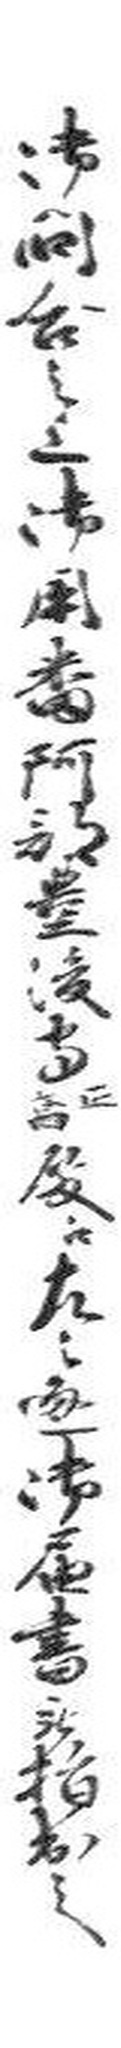御問合之上御用番阿部豊後守正喬殿江左之通御届書被指出
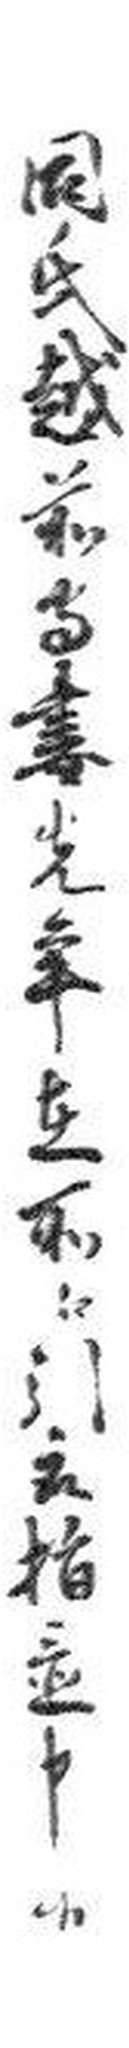同氏越前守妻先年在所江引取指置申候
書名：家譜 二十九 吉邦公 従正徳二年到正徳三年
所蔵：福井県文書館 Fukui Prefectural Archives
